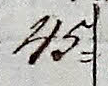45
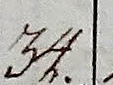34.
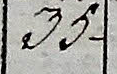35
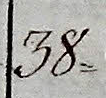38
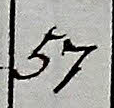57
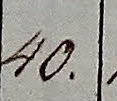40.
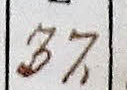37.
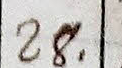28.
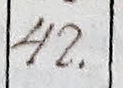42.
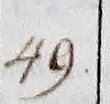49
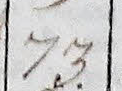73.
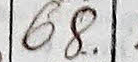68.
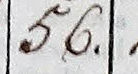56.
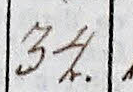34.
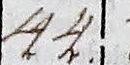44.
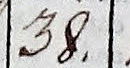38.
